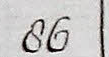86
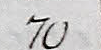70
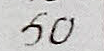50
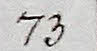73
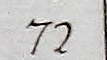72
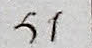51
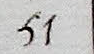51
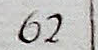62
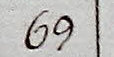69
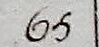65
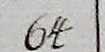64
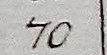70
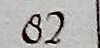82
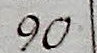90
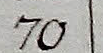70
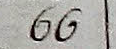66
